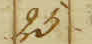25
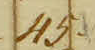45
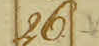26.
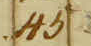45
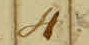4
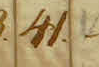41.
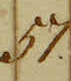57.
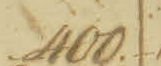400.
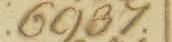6937.
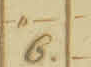6.
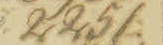2251.
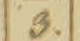3.
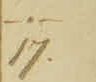17.
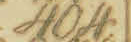404.
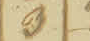3
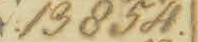13854.
